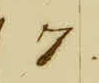7
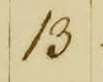13
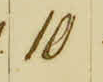10
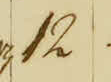12
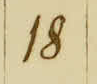18
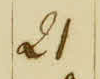21
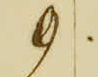9
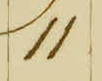11
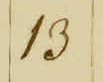13
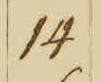14
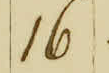16
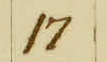17
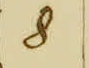8
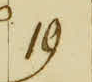19
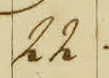22
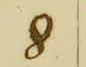8
